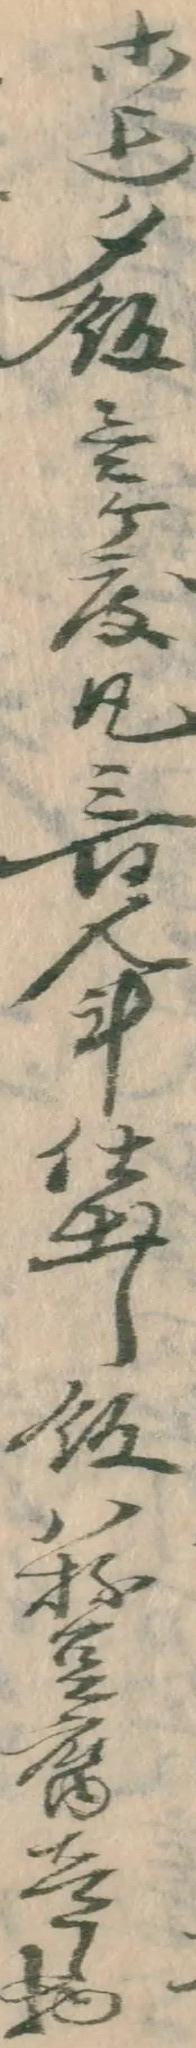こ迄夕飯壱ヶ度凡三百人斗仕出し飯八拾豆腐壱丁物
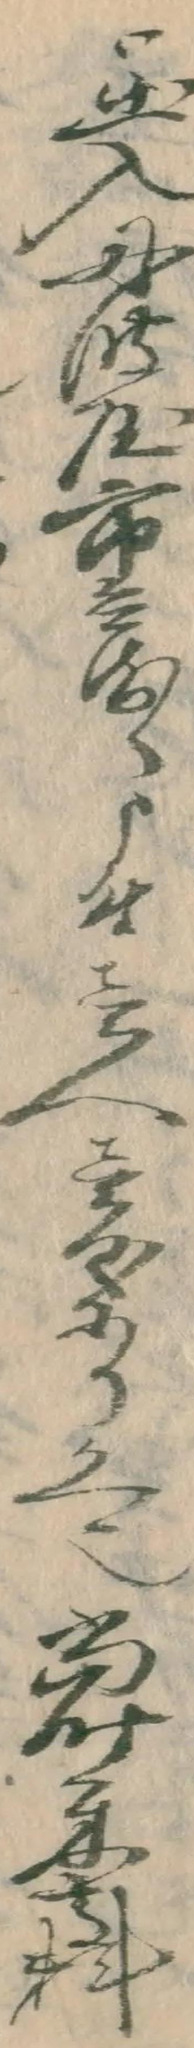御出入丹波屋市兵衛へ申付壱人壱匁ふりかへ也當時米高料
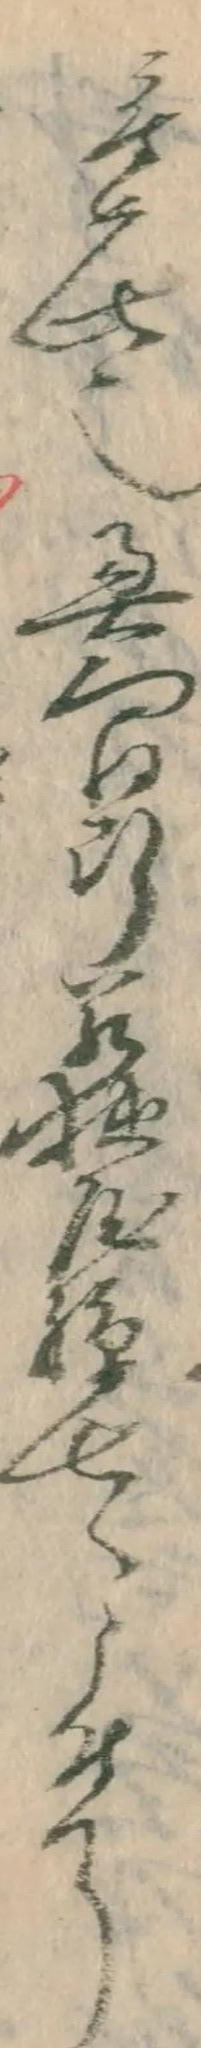ニ付如此也奥向同断箱挟屋経七へ申付了
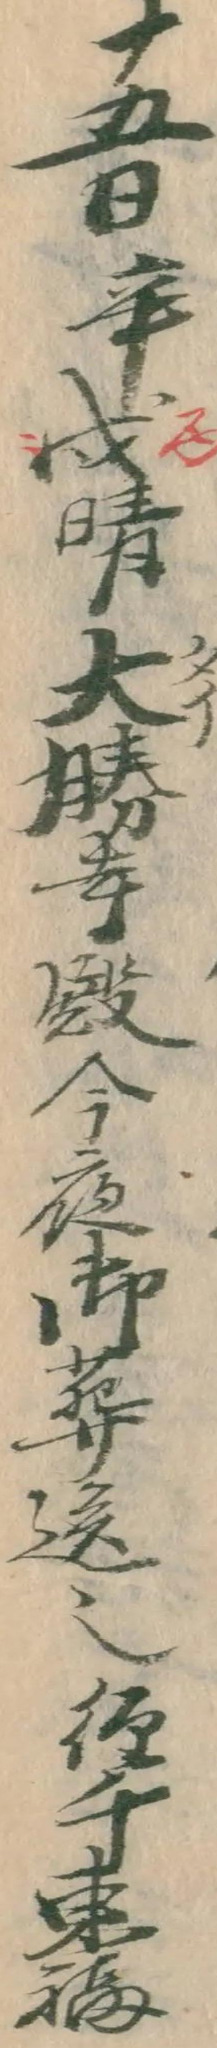十五日辛戌晴大勝寺殿今夜御葬送也経千東福

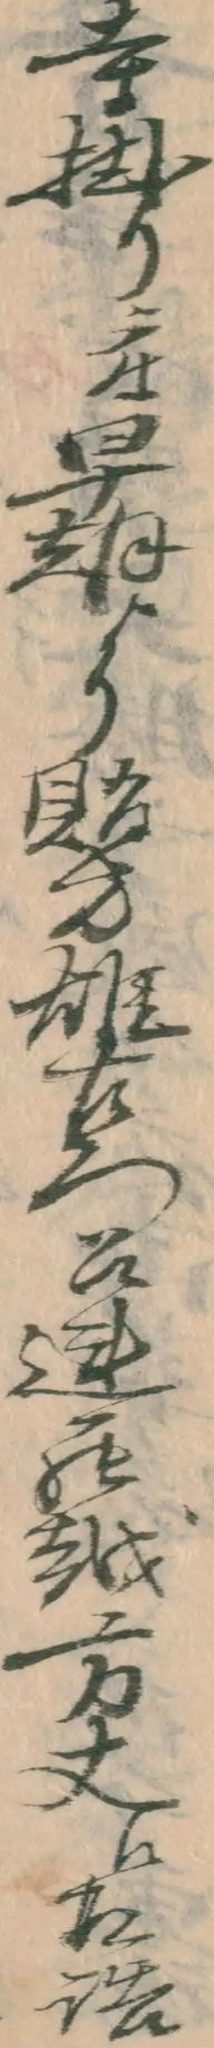寺掛りニ付早朝より賄方雄左衛門召連罷越方丈え相詰
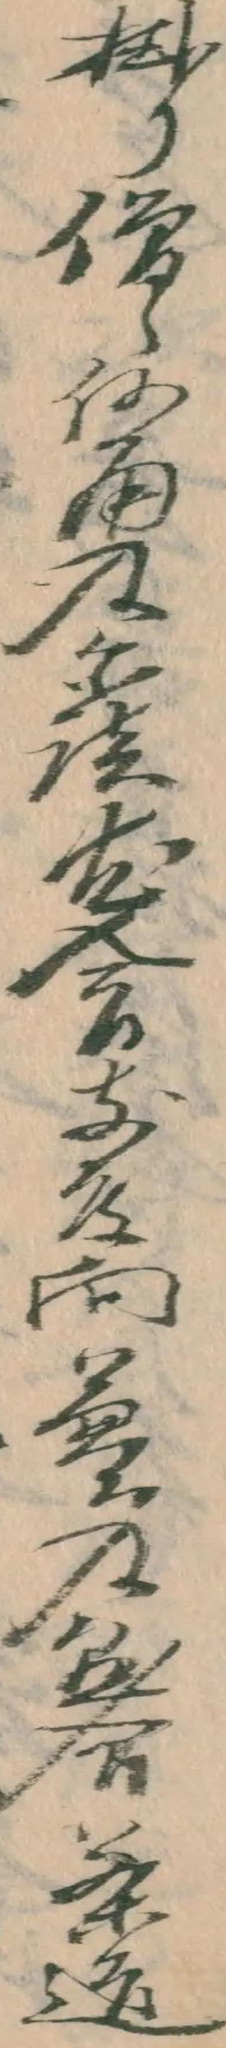掛り僧ヘ何角及条談尤今日支度向兼而及懸合茶道
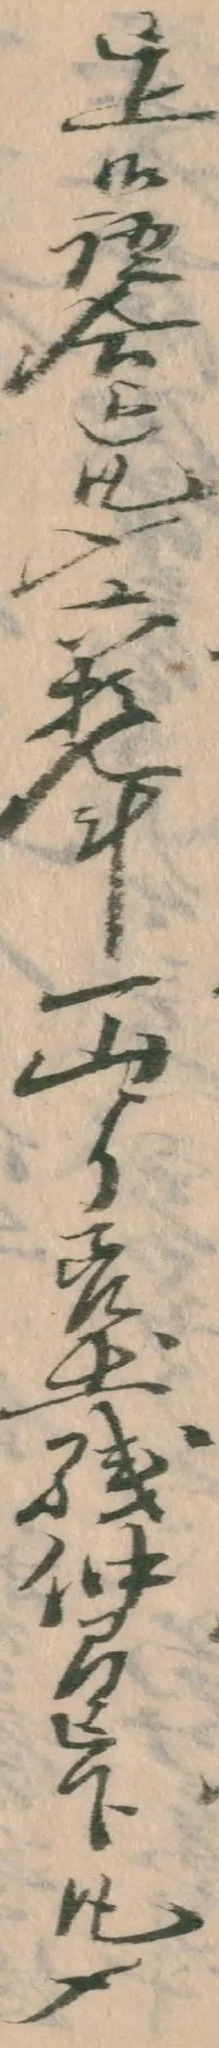已上御詰合迄凡〆六拾人斗一山より差出残仲間已下凡〆
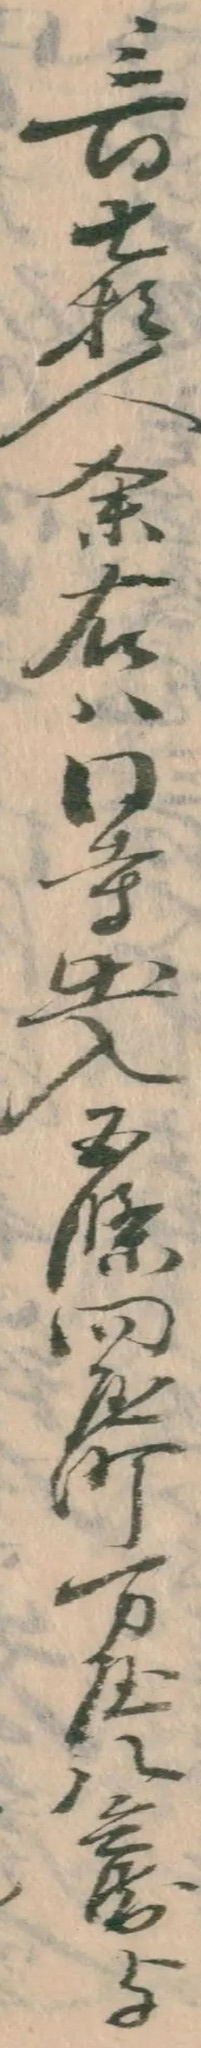三百七拾人余右ハ同寺出入五條問屋町万屋八兵衛与
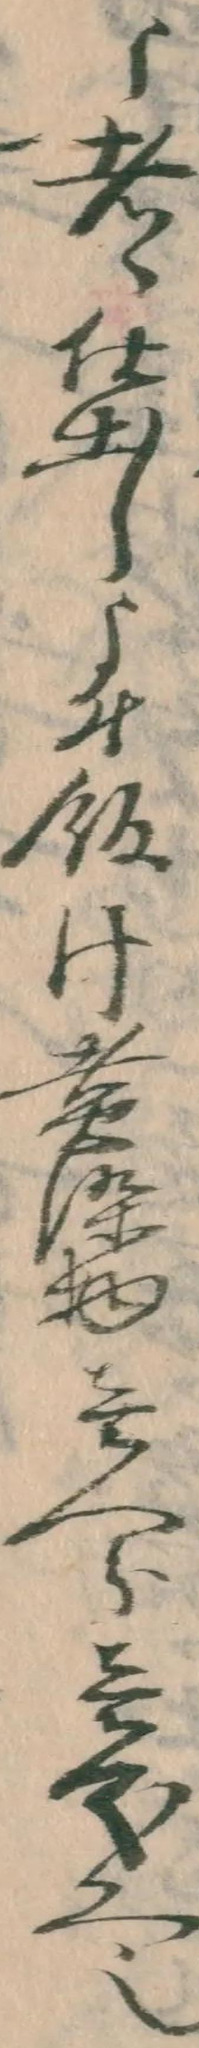申者へ仕出し申付飯汁煑染物壱人分壱匁かへ也
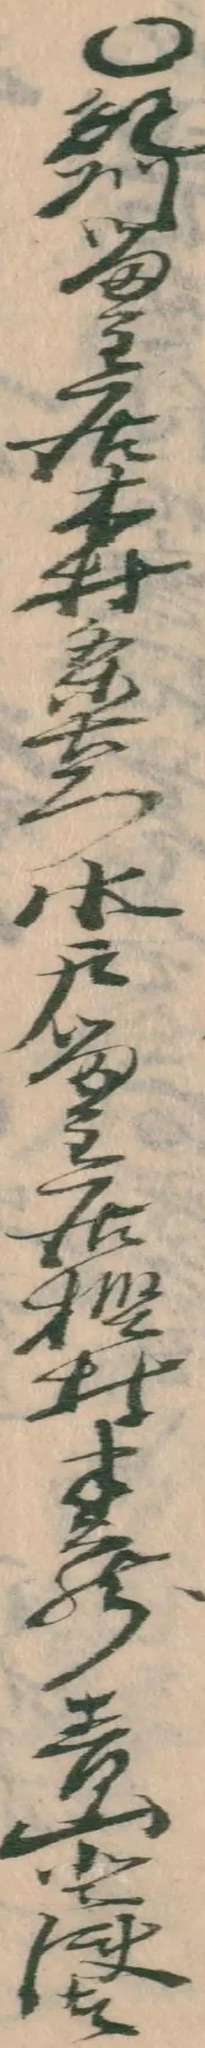○紀州留主居本村五郎右衛門水戸留守居櫻村半蔵青山北使者
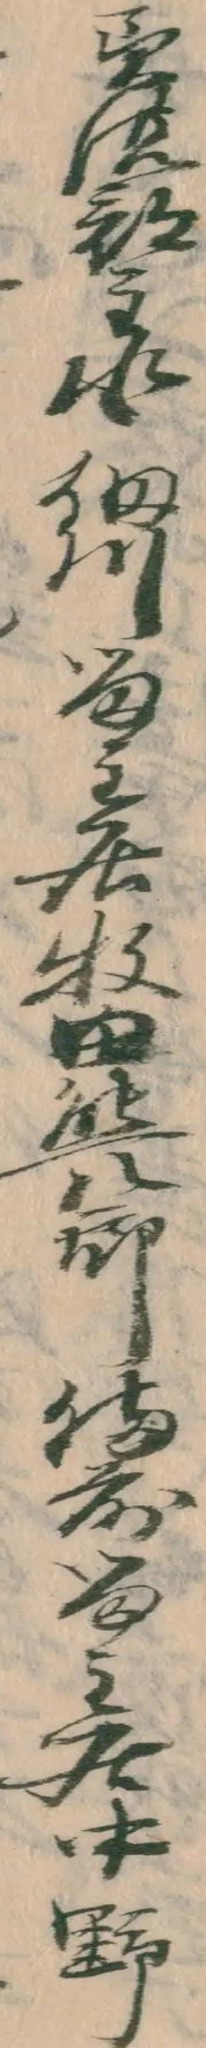美濃部主水細川留主居牧田熊八郎備前留守居中野
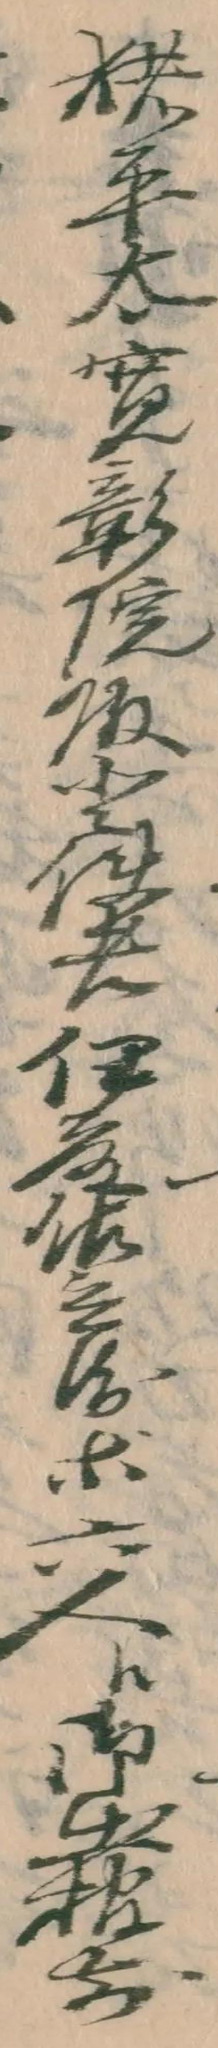猪平太寛彰院殿登使者伊藤佐兵衛等六人え御出棺前
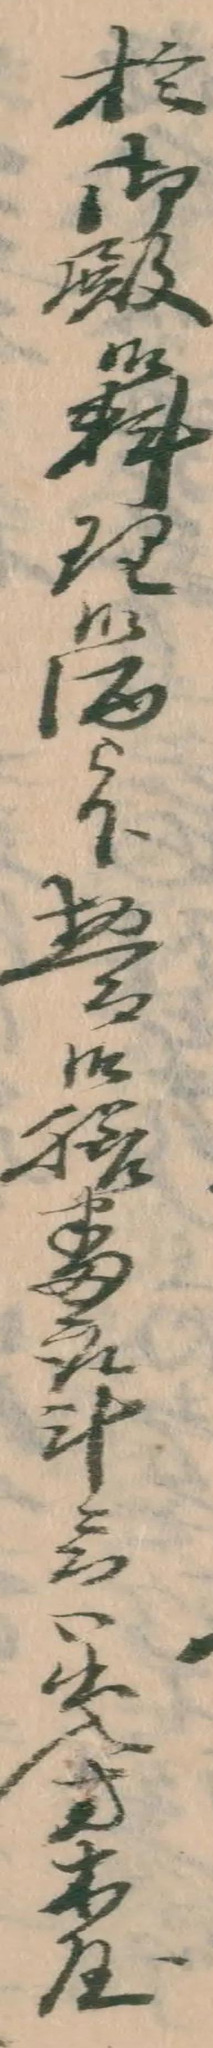於御殿御料理御酒被下惣而御膳番取斗ニ而御出入方木屋
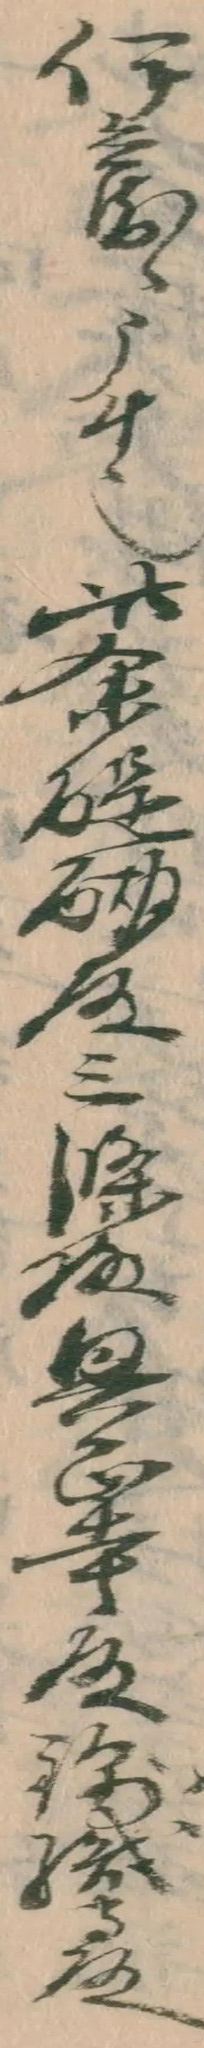伊兵衛へ申付也此余醍醐殿三條殿興正寺殿錦織寺殿
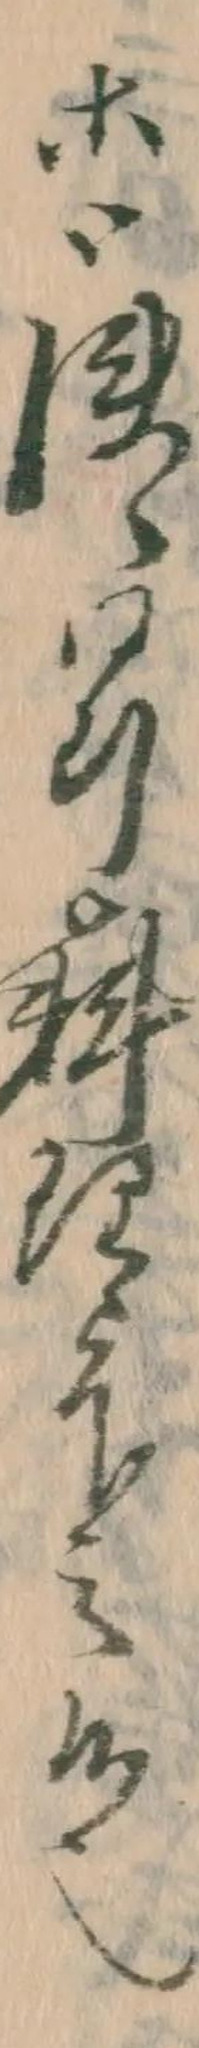等御使へ同断御料理被下之候也
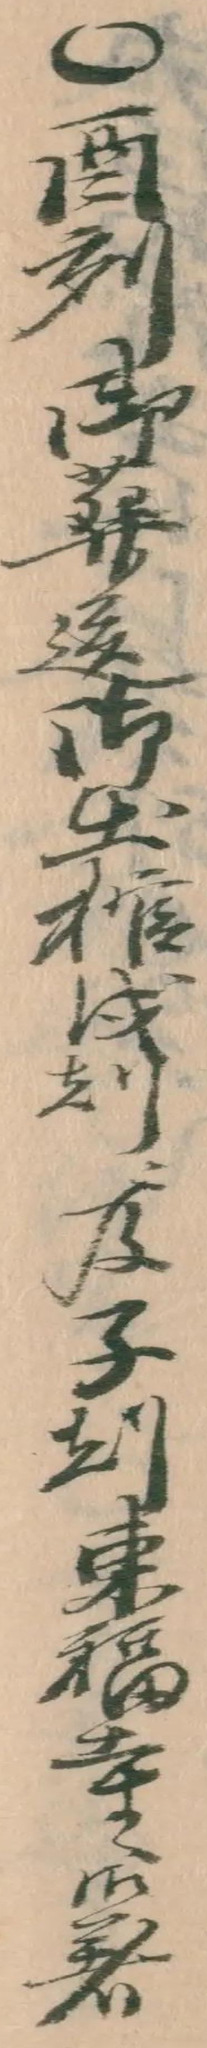◯酉刻御葬送御出棺戌刻及子刻東福寺へ御着
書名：賀茂社記録. 第67冊
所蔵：国立国会図書館 National Diet Library, JAPAN
